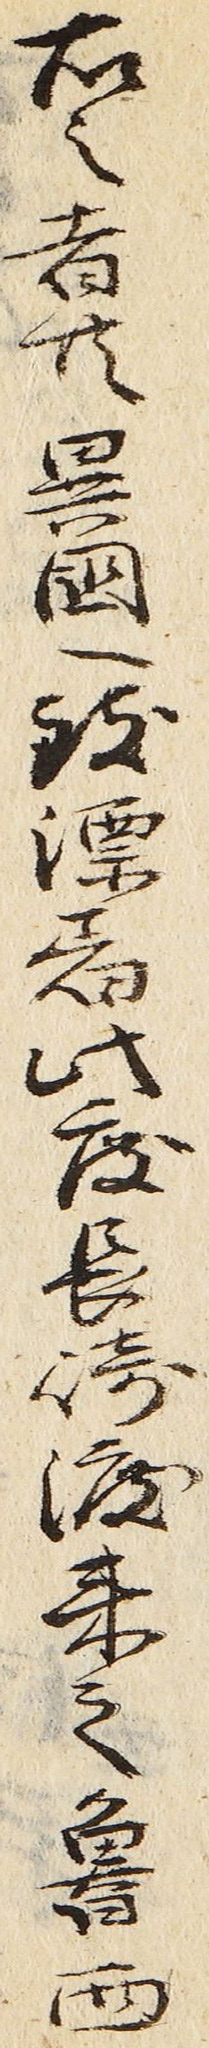右之者共異国へ致漂着此度長崎渡来之魯西
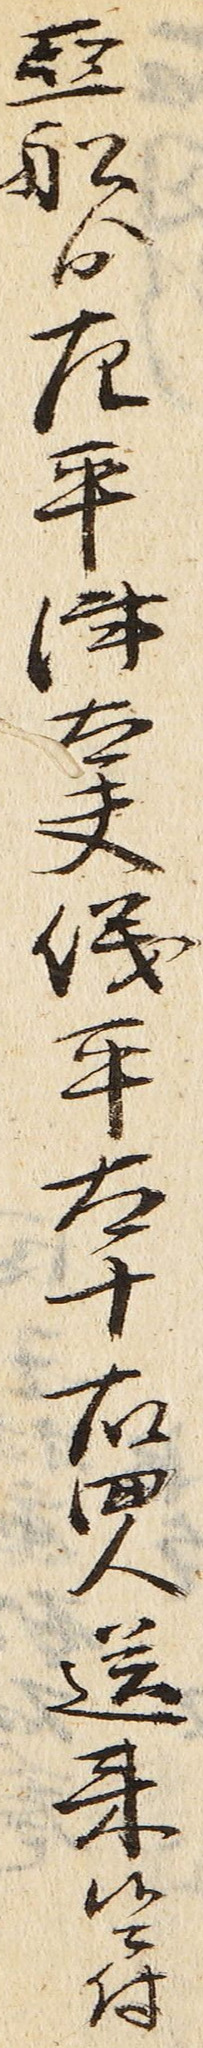亜船ゟ左平津太夫儀平太十右四人送来候に付
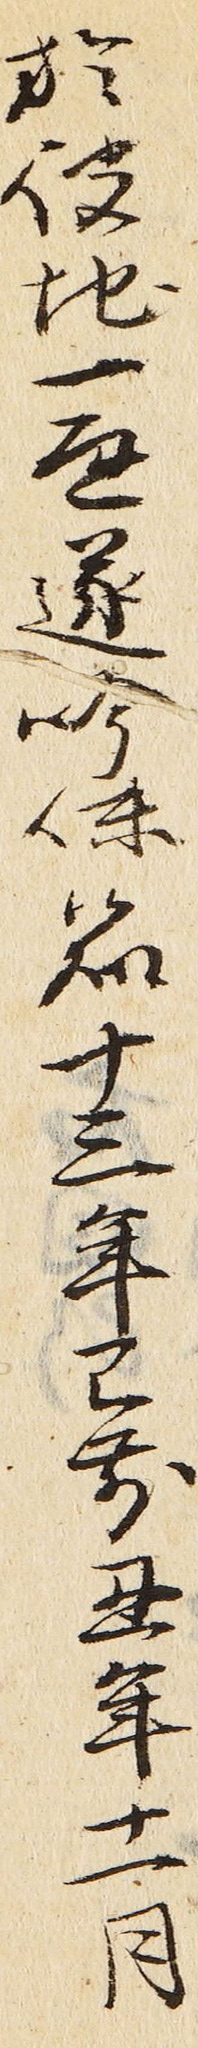於彼地一通遂吟味候処十三年已然丑年十一月
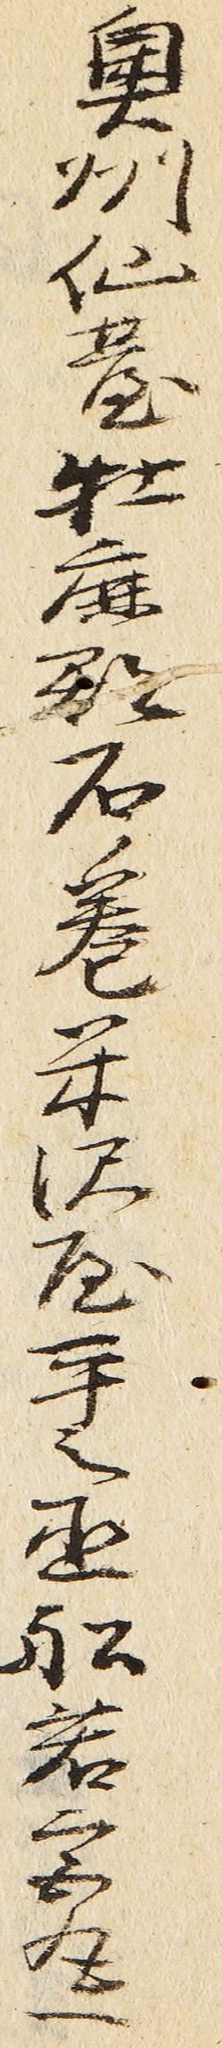奥州仙台牡鹿郡石ノ巻米沢屋平之丞船若宮丸へ
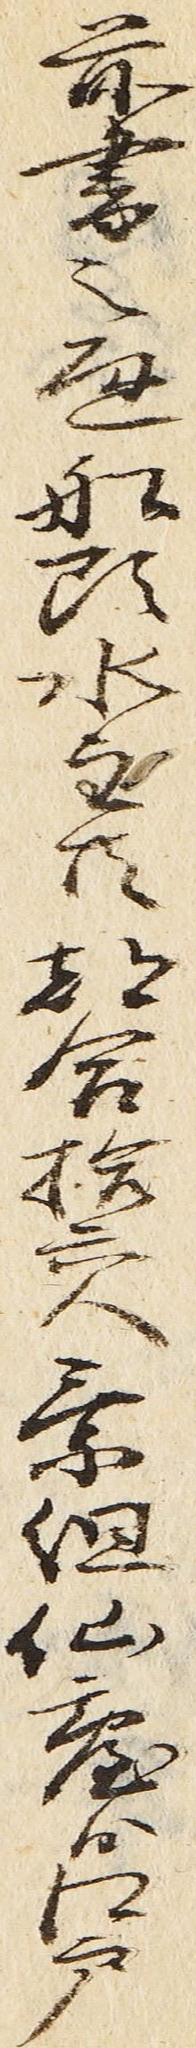前書之通船頭水主共都合拾六人乗組仙台ゟ江戸
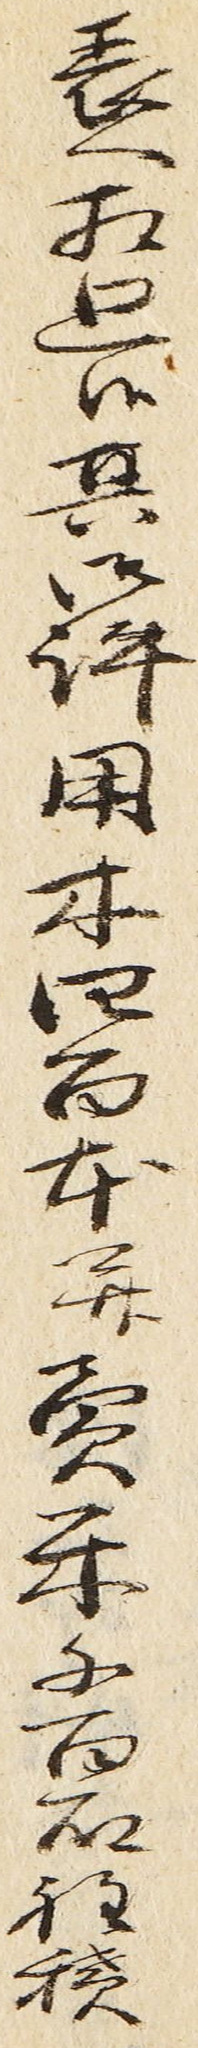表へ相廻候其御許用木四百本并売米千百石程積
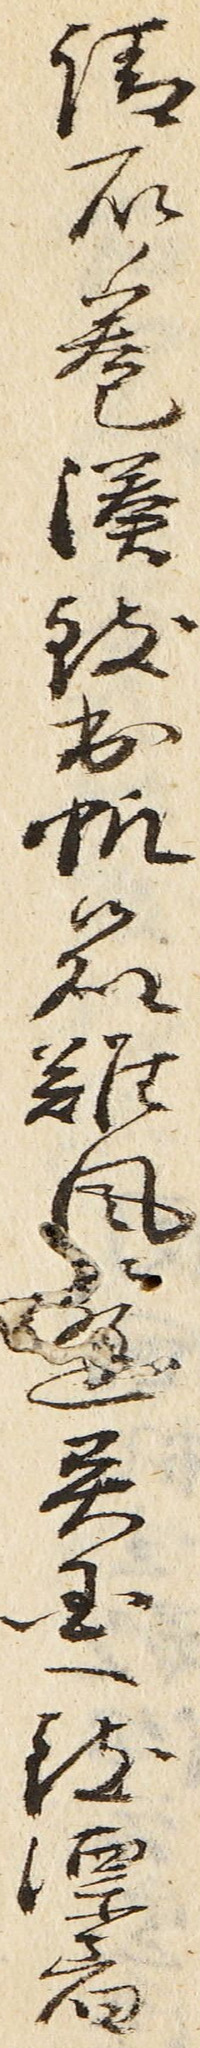請石ノ巻湊致出帆候処難風に逢異国へ致漂着
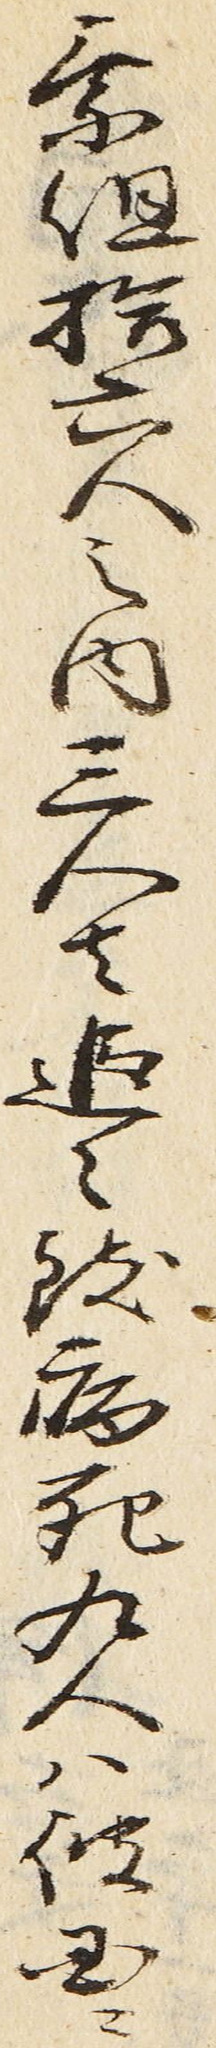乗組拾六人之内三人は追々致病死九人は彼国に
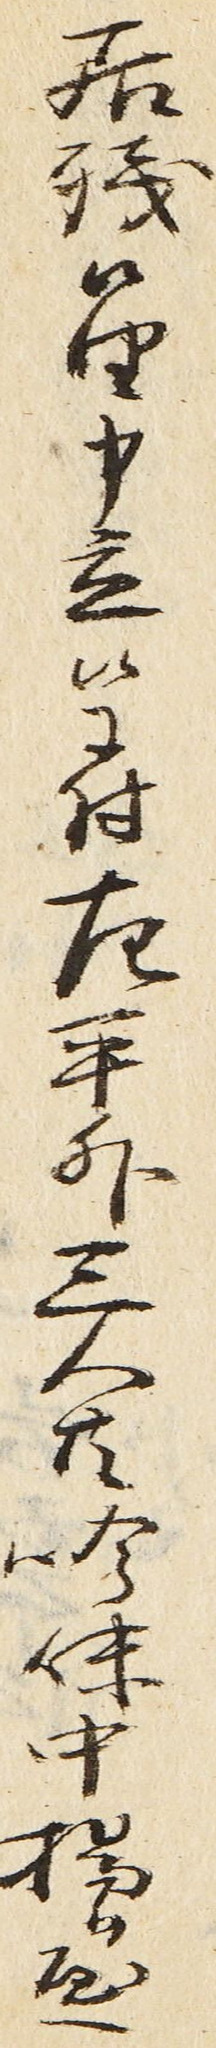居残候由申立候に付左平外三人共吟味中揚ヶ屋へ
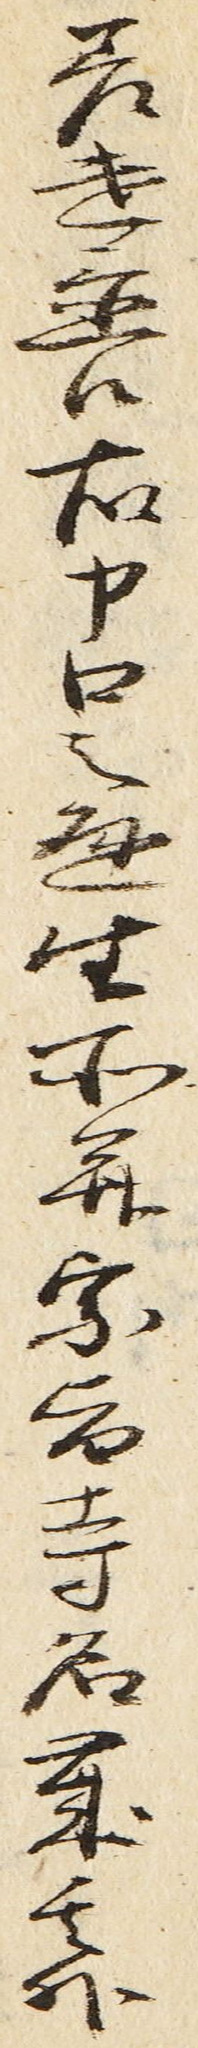差遣置候右申口之通生所并宗旨寺名歳其外
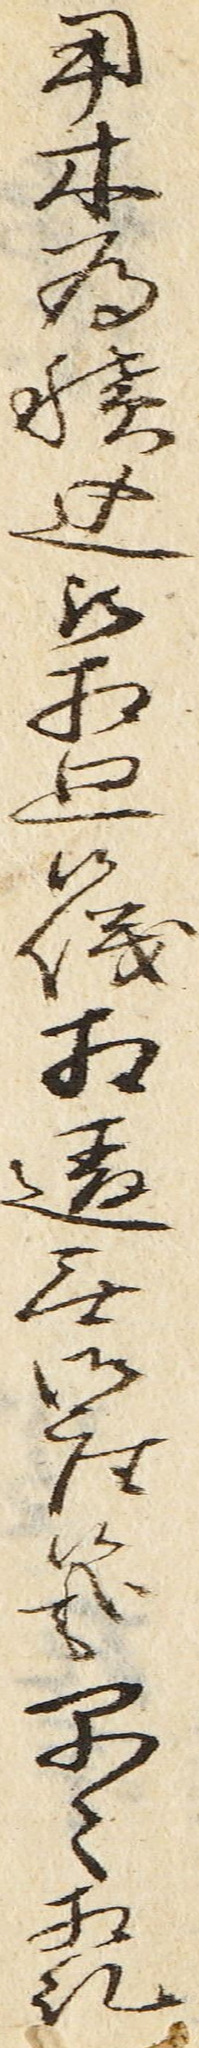用木為積込被相廻候儀相違無御座候哉早々相糺
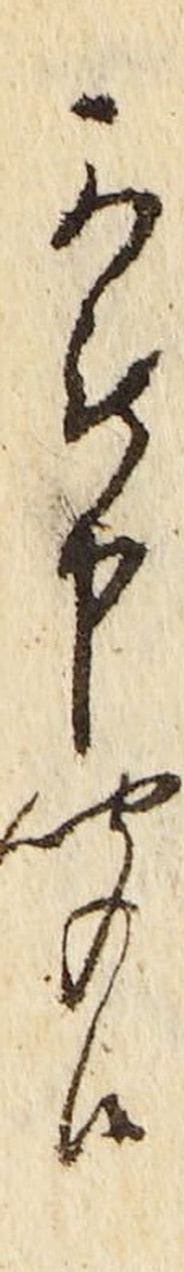可被申聞候

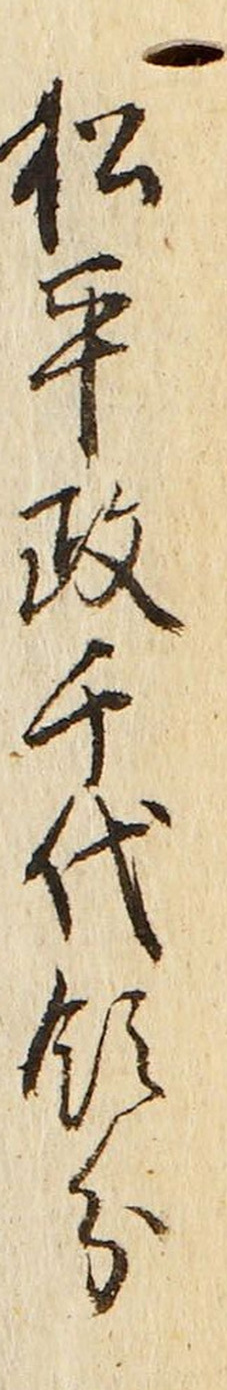松平政千代領分
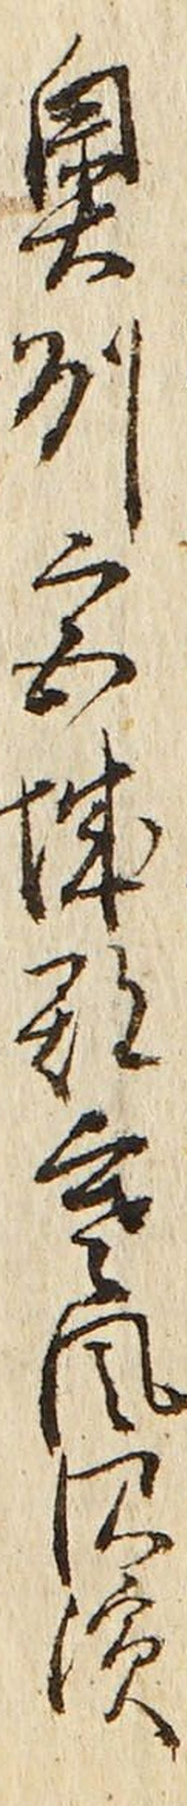奥州宮城郡寒風沢浜
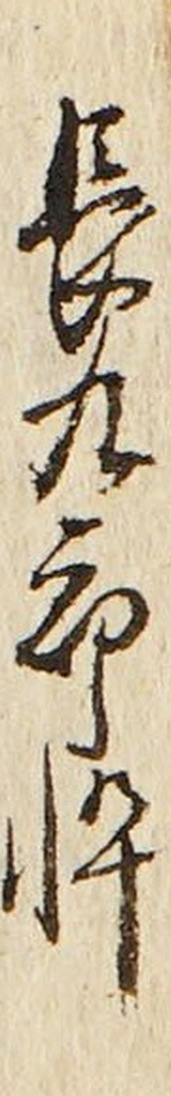長九郎悴
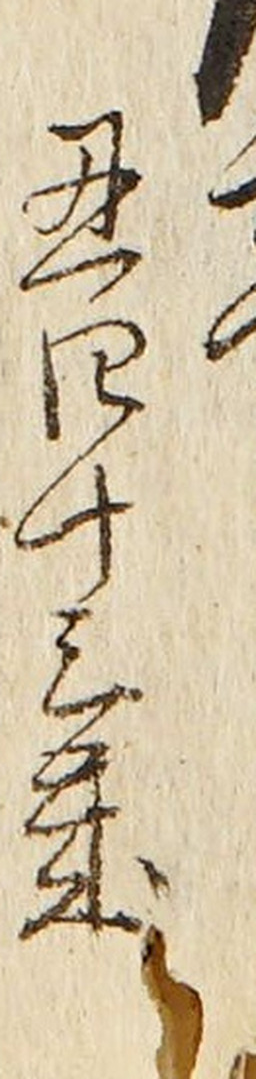丑四十三歳
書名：漂民後記
